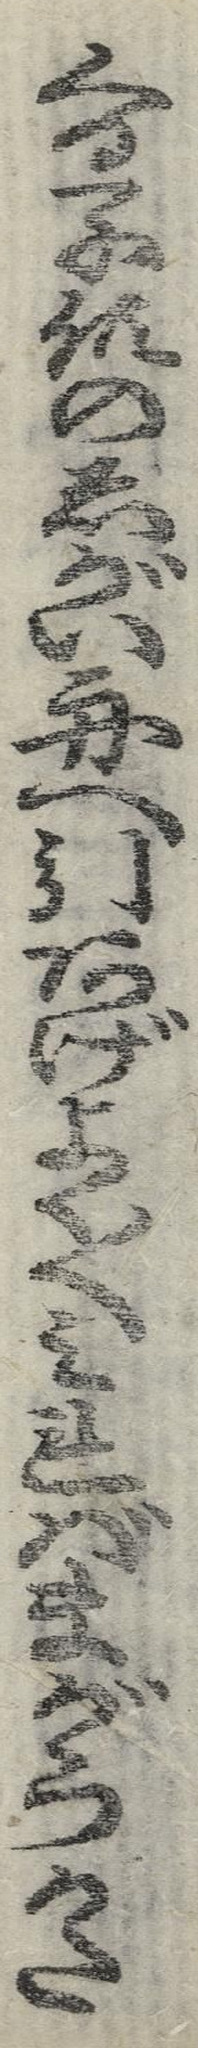くる子供のしがい舟へ引あげよく〳〵みればまがうかた
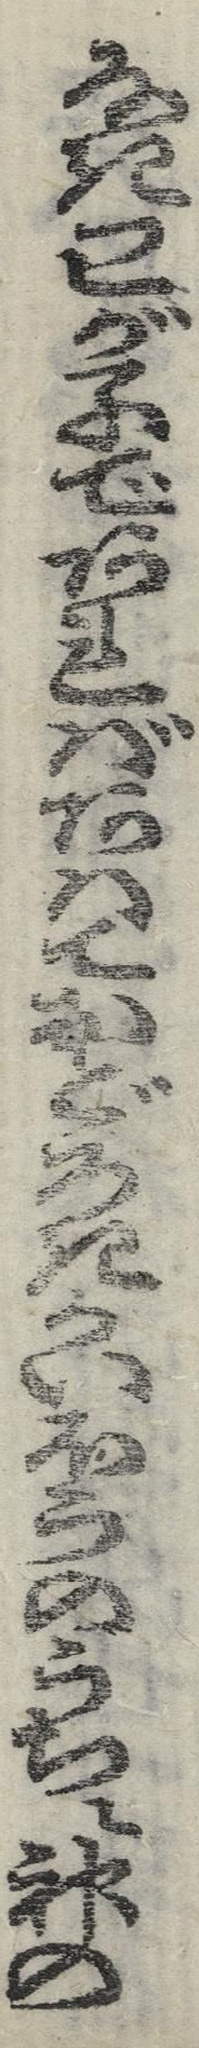なきわが子であればあはておどろきかいほうのうちに神の
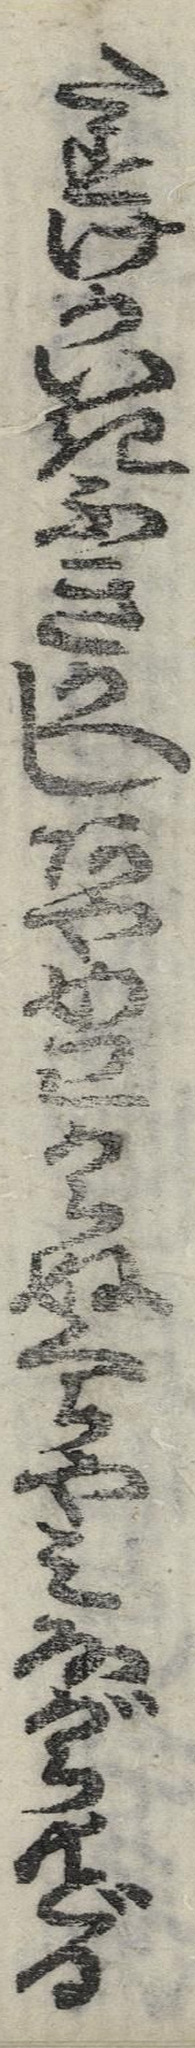たすけかいきふきかへしあやめわからねくらやみながらもどる
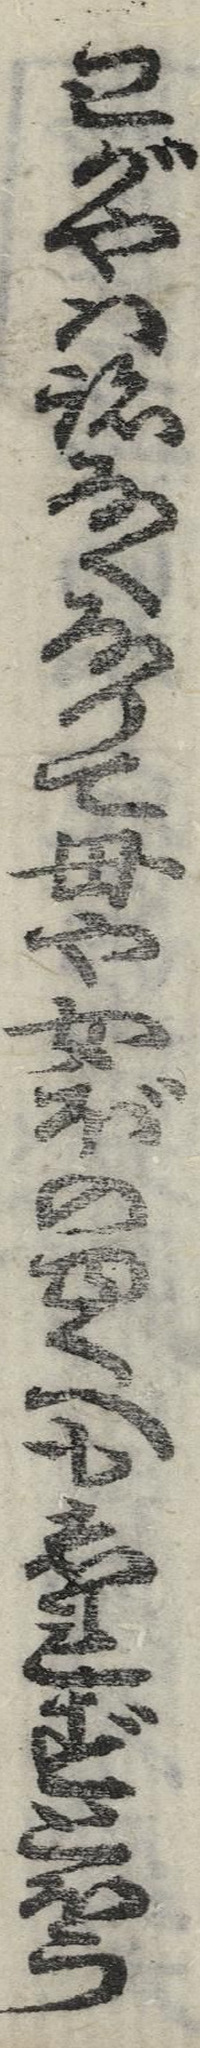わがやは跡なくなりて母や女ぼのゆくへもしれずとほう
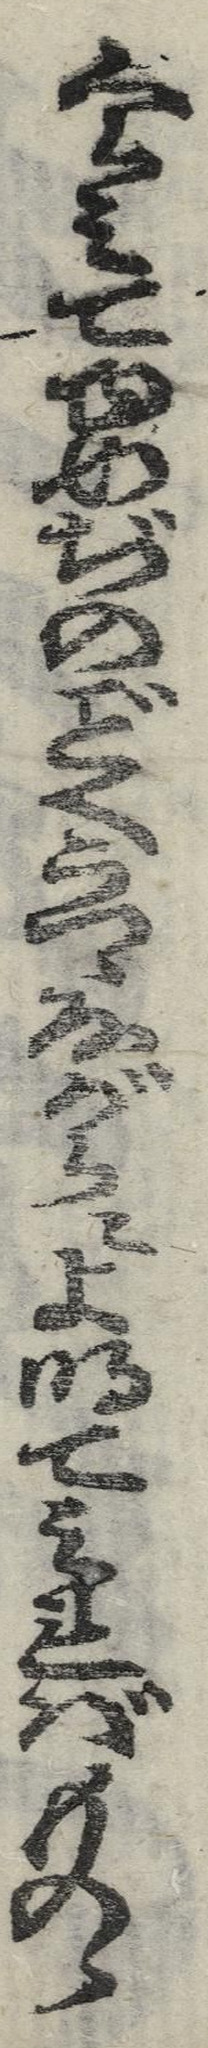くらみてゆめぢのごとくうつゝながらによ明てみればものゝ
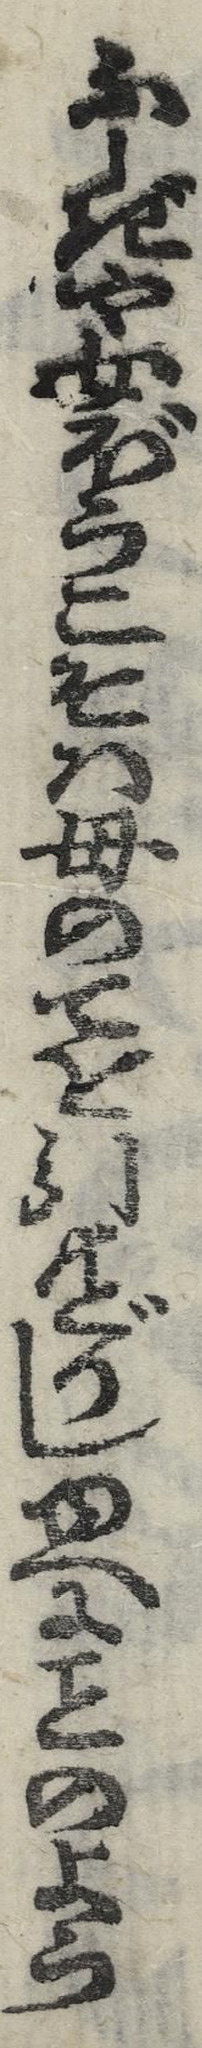ふしぎや女ぼうこそは母のてを引もどりしゆへにことのよう
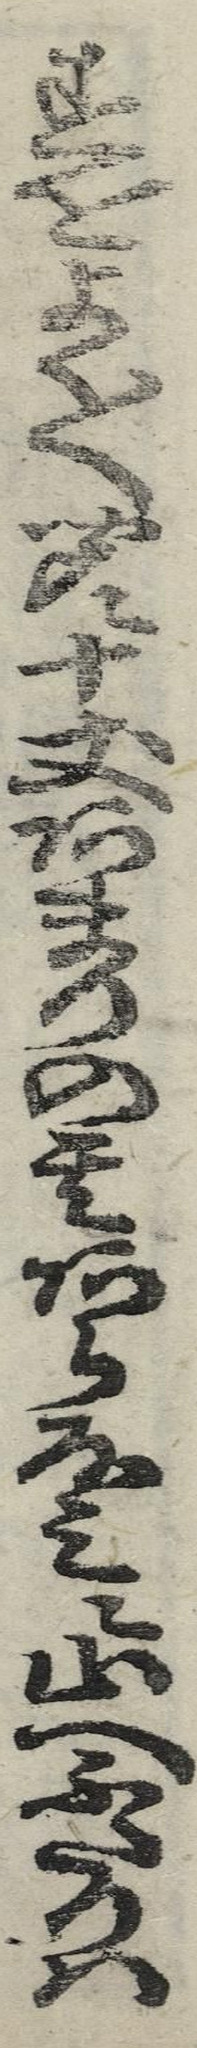すをよく〳〵聞に十丈あまりの其あらなみに山へふたりは
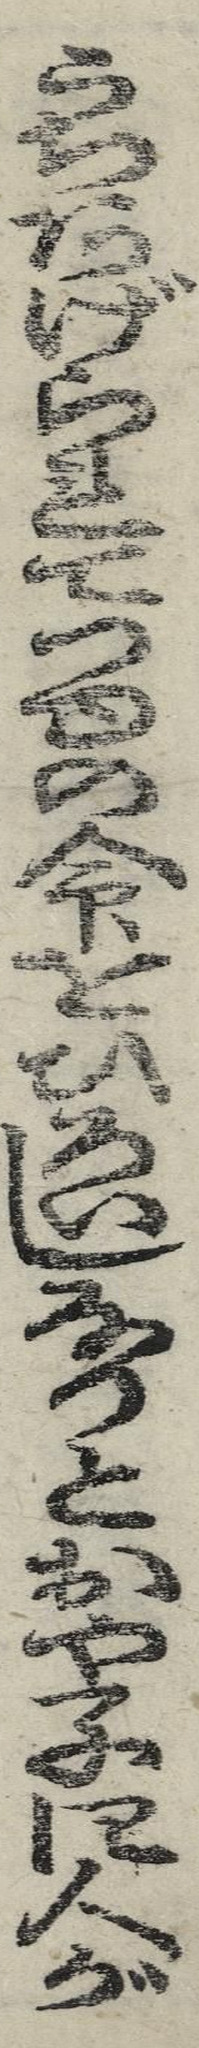うちあげられてつゆの命をひろいしなりとおや子四人が
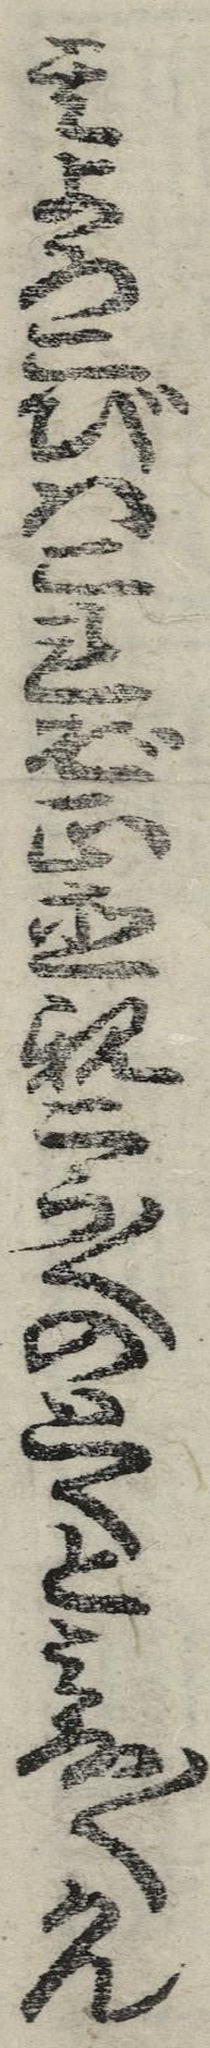其よろこびはこれぞ正直親こう〳〵のとくとみな〳〵かん
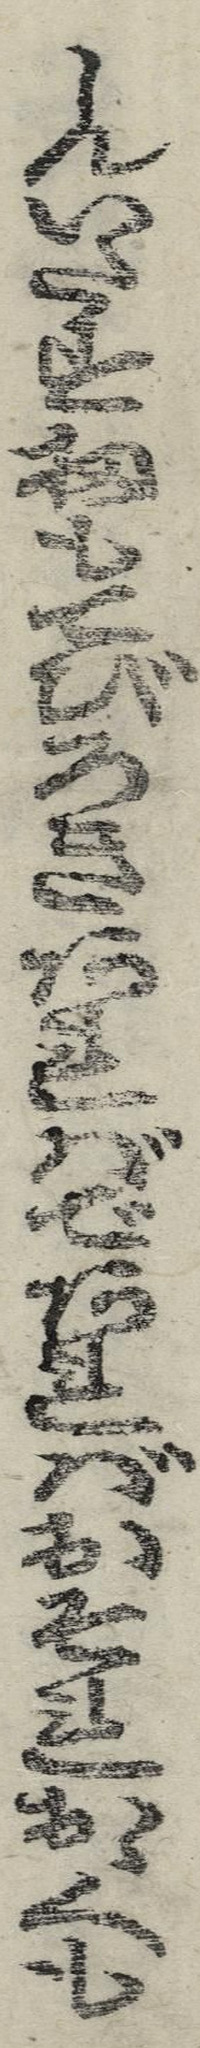しんいたす扨もてびろきあればであればおそれおゝくも
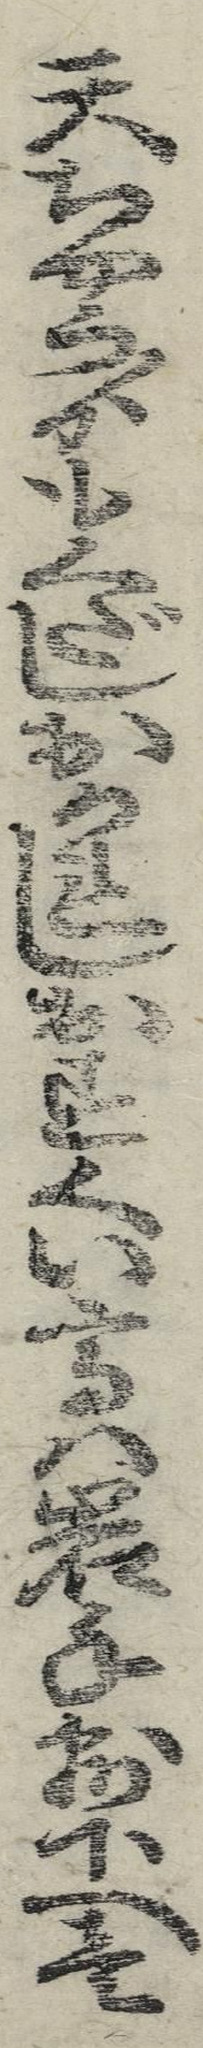天ちやうゟもくだしおかれしおすくい高は岩手県下へ壱
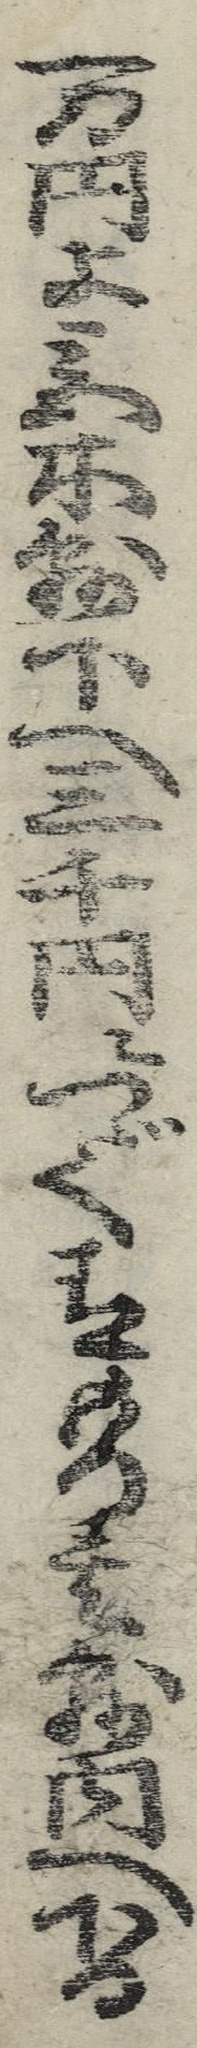万円よ宮木県三千円につゞく青もりは県内へ下る
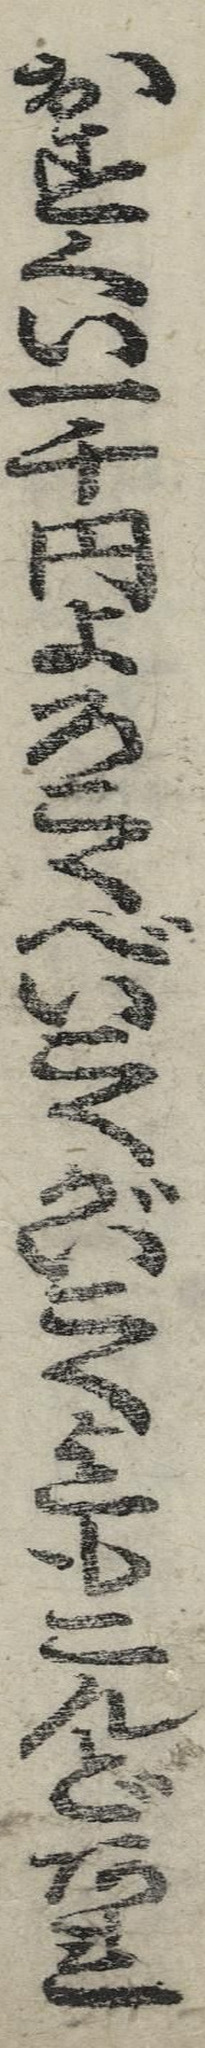おすくい一千円よろこへべいこくがいこく迄もこんどあれ
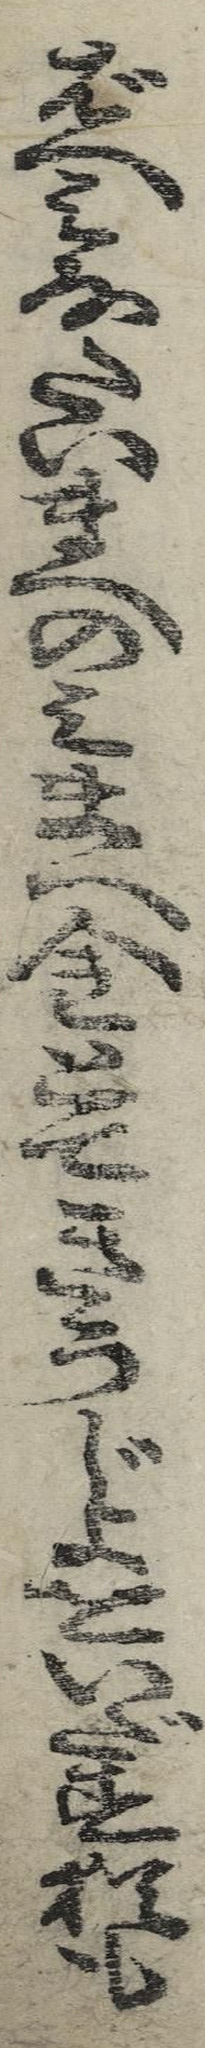ばへみなたいまへのみまへ金とてきうじよをいだす猶も

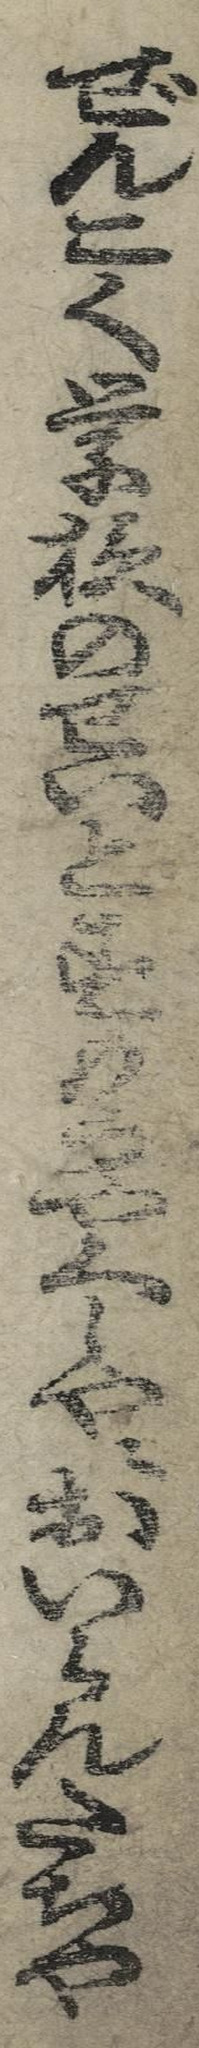ぜんこく学校のせいとすもう？やくしやにおいらんたちや
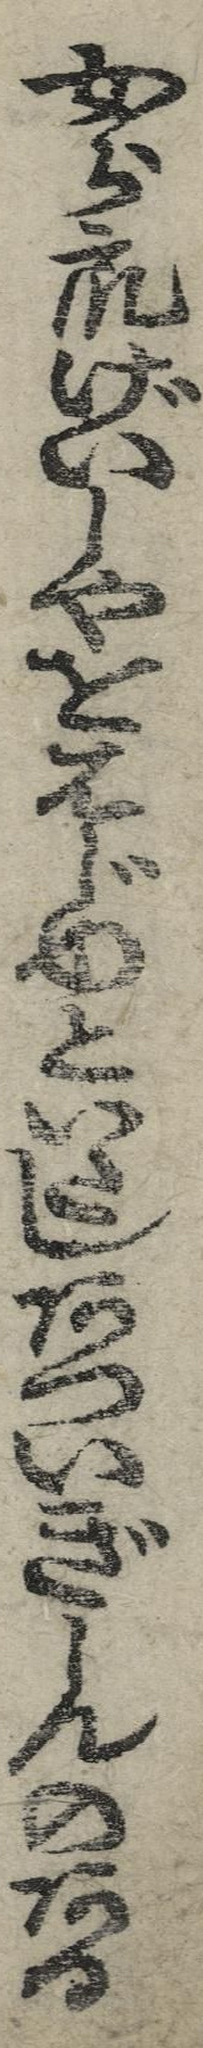女郎衆げいしやをはじめといたしあついぎしんのある
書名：奥州すじ大つなみおおあれくどき
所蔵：東京大学地震研究所図書室 Earthquake Research Institute Library, The University of Tokyo, JAPAN
